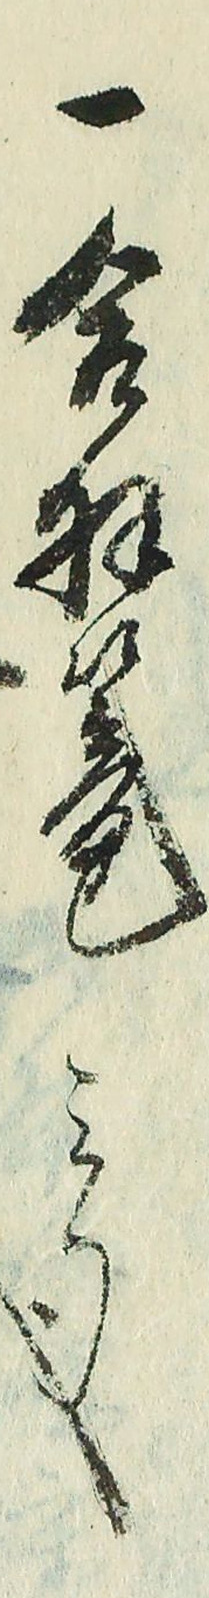一合羽篭三つ
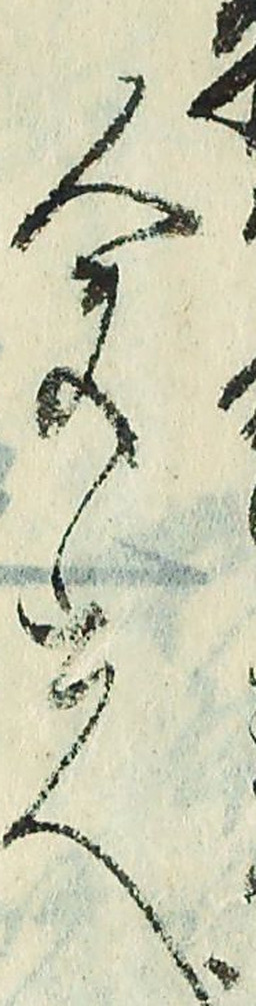人夫六人
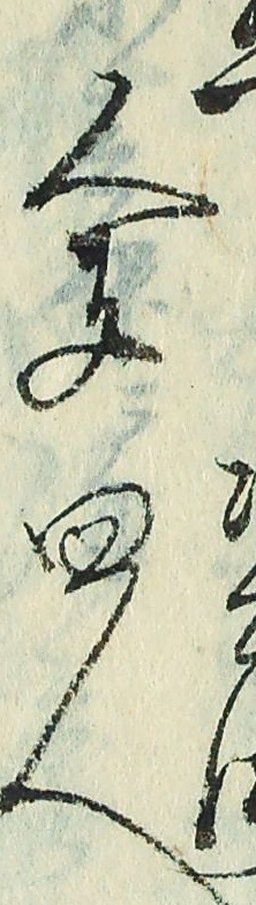人夫四人
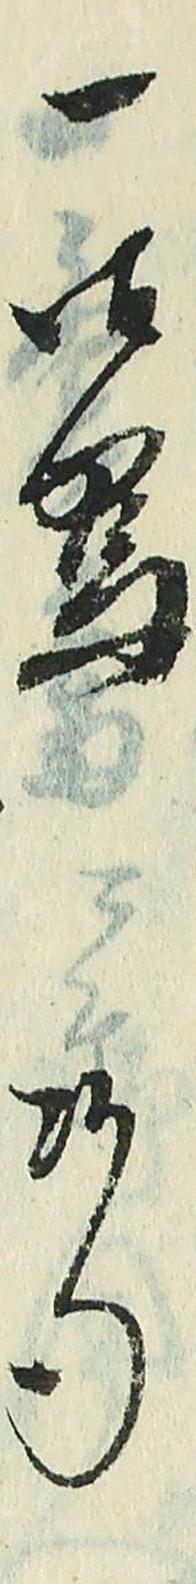一御駕弐つ
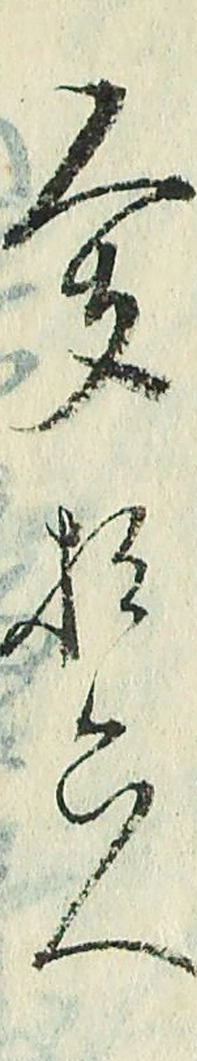人夫拾六人
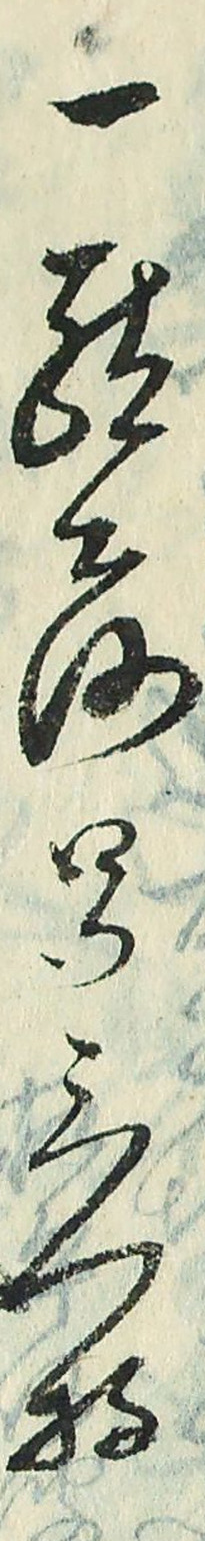一駄荷四つ三人持
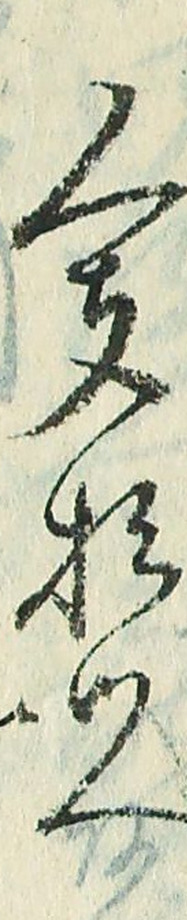人夫拾弐人
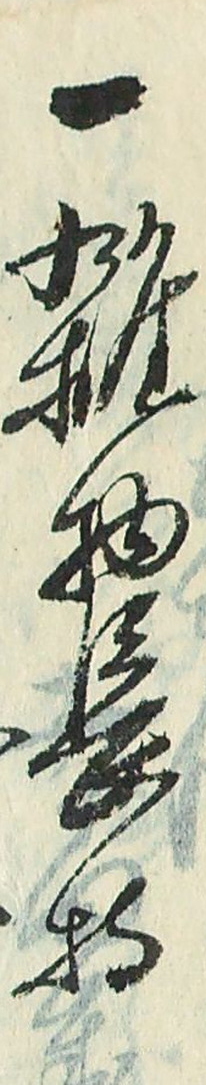一雑物長持
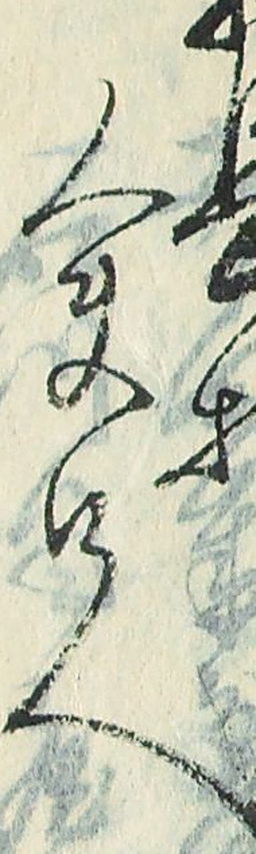人夫四人

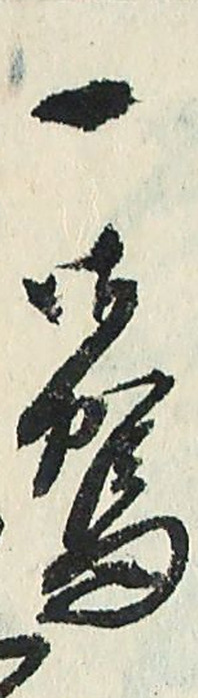一御駕
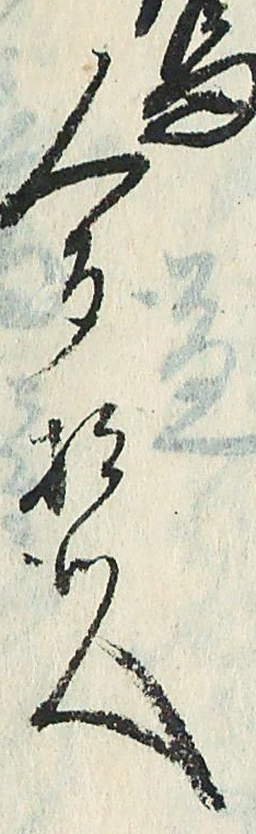人夫拾弐人
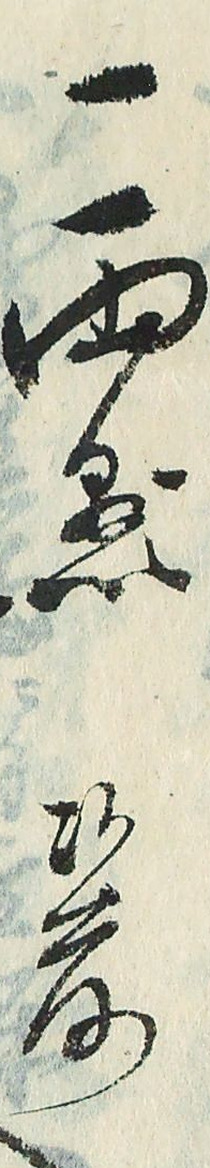一両懸弐荷
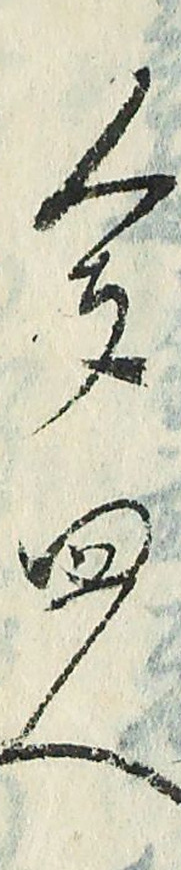人夫四人
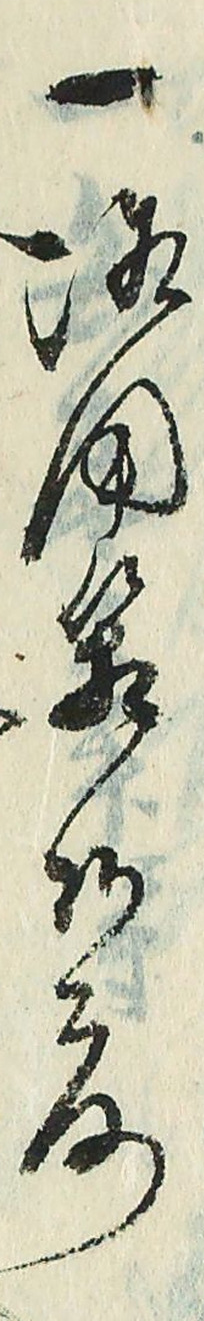一御用箱弐荷
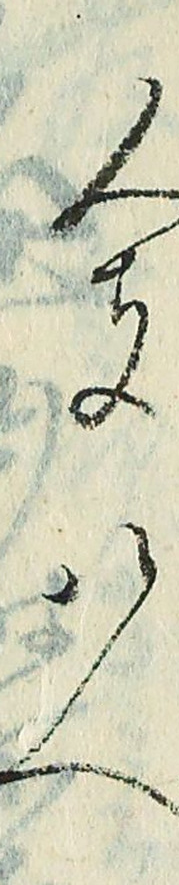人夫八人
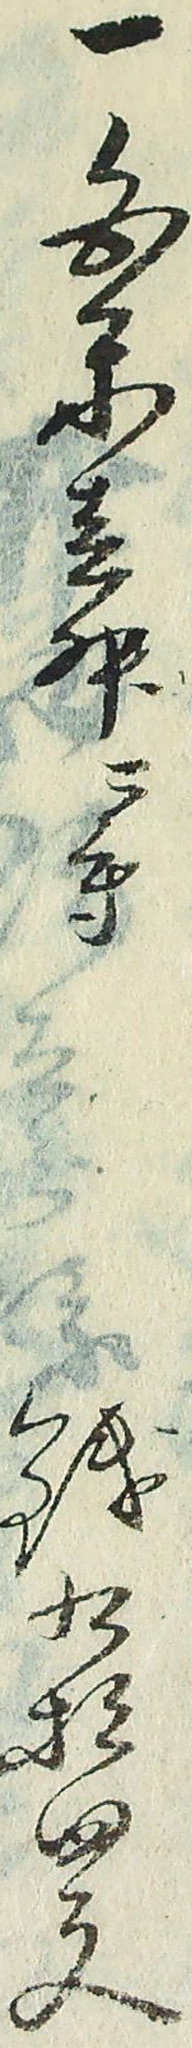一白米壱升に付銭九拾四文
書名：公辺御役人為御廻浦御立越諸御用一巻
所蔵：鳴門教育大学 Naruto University of Education
